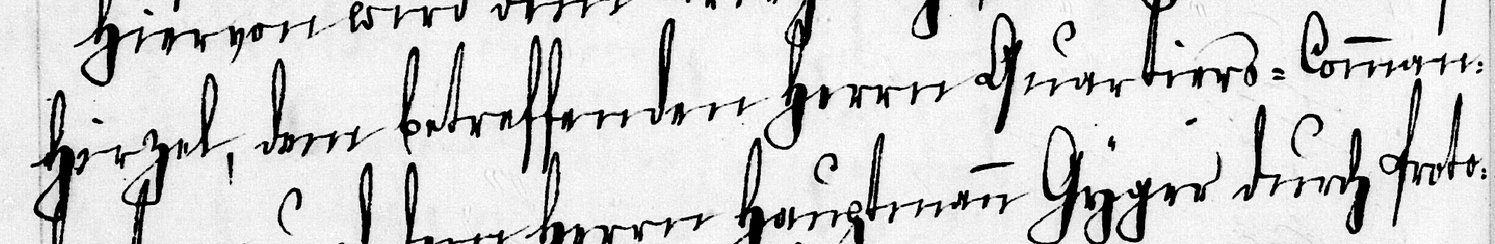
Hirzel, dem betreffenden Herrn Quartiers-Comman¬
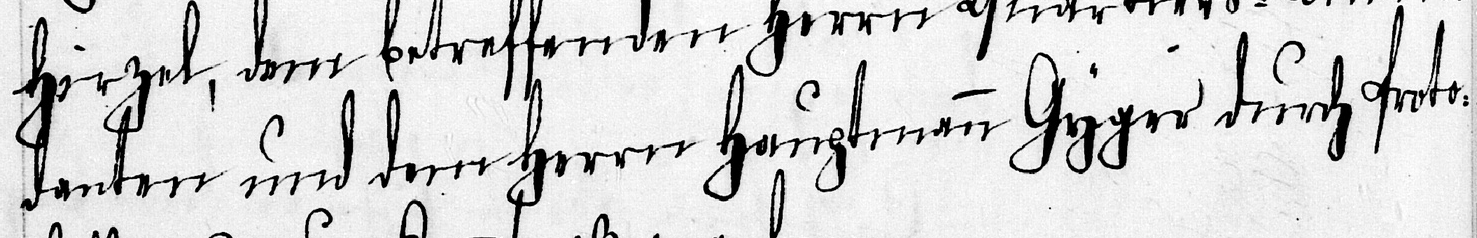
danten und dem Herrn Hauptmann Gyger durch Proto¬
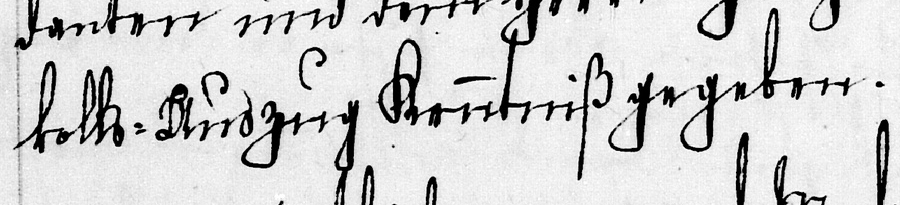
kolls-Auszug Kenntniß gegeben.
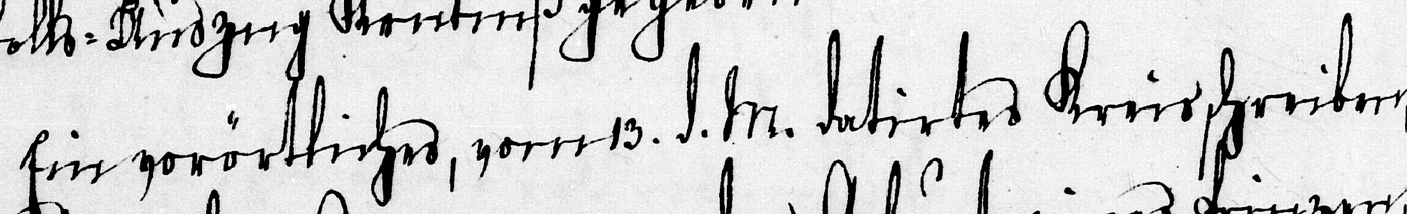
Ein vorörtliches, vom 13. d. M. datirtes Kreisschreiben,
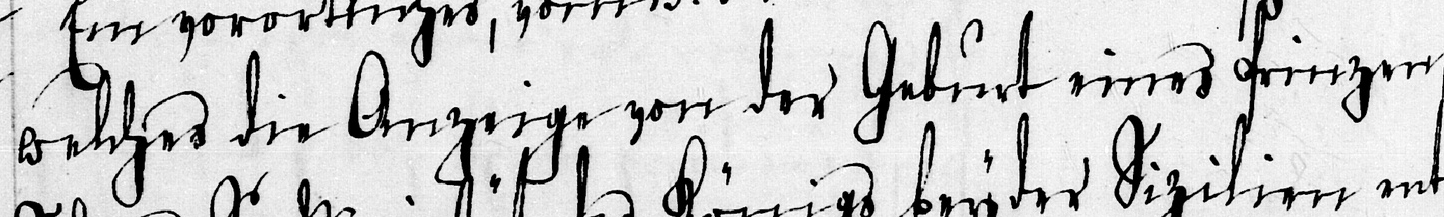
welches die Anzeige von der Geburt eines Prinzen,
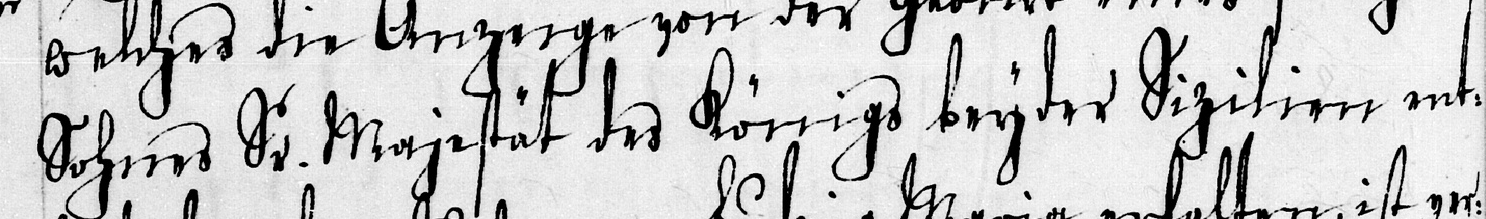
Sohnes Sr. Majestät des Königs beyder Sizilien ent¬
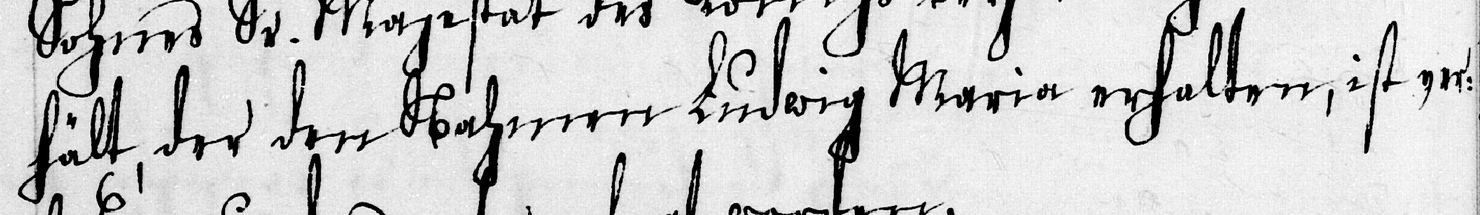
hält, der den Nahmen Ludwig Maria erhalten, ist ve¬
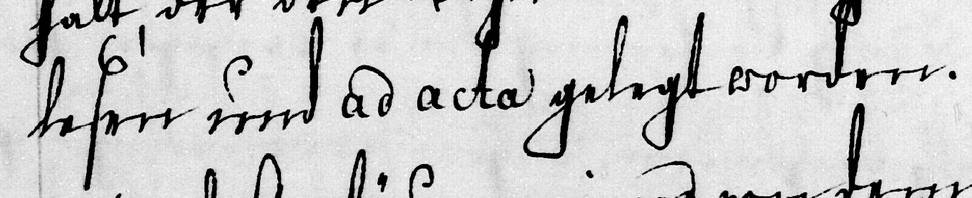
rlesen und ad acta gelegt worden.
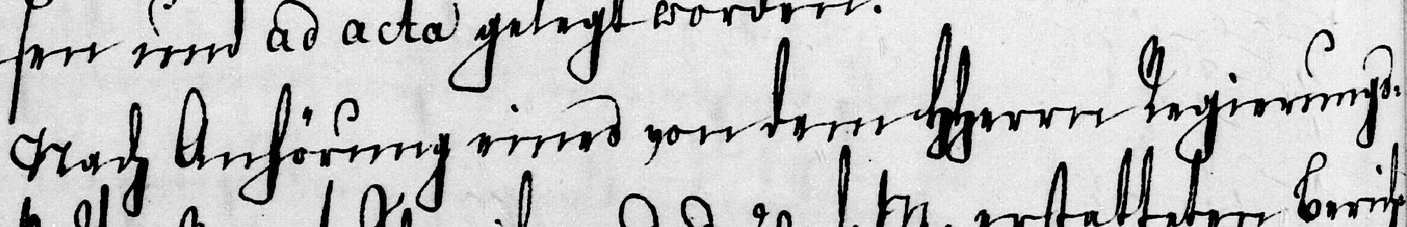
Nach Anhörung eines von dem HHerrn Regierungs¬
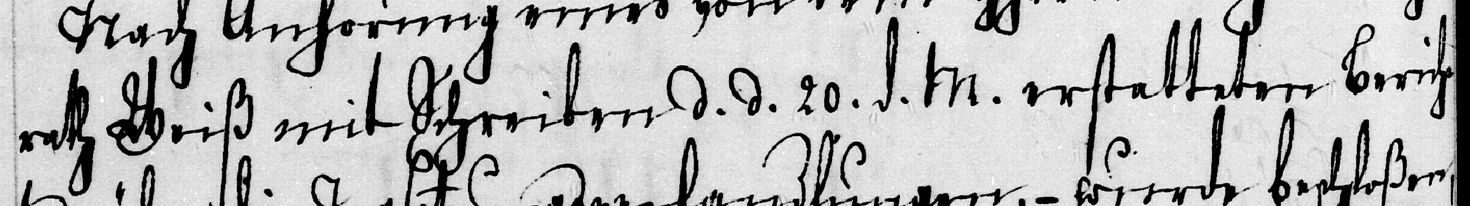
rath Weiß mit Schreiben d. d. 20. d. M. erstatteten Berich¬
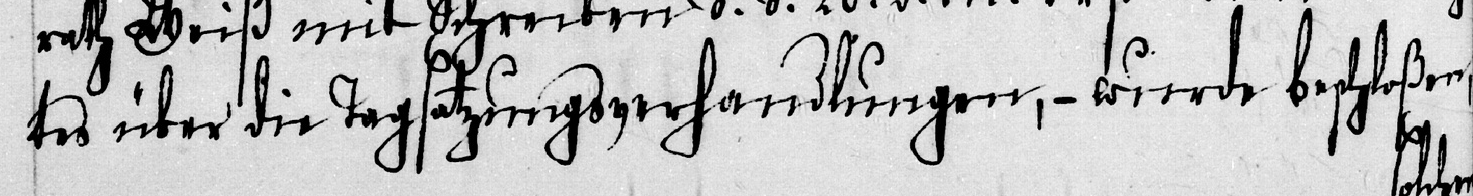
tes über die Tagsatzungsverhandlungen, – wurde beschloßen,
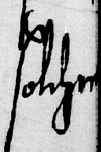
eh¬
